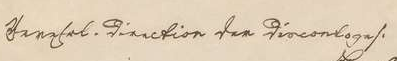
Verehrl. Direction der Discontoges.
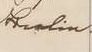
Berlin.
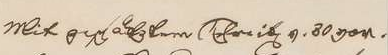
Mit geschätztem Schreiben v. 30 vor.
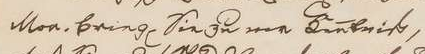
Mon. bringen Sie zu mr Kenntniß,
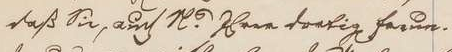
daß Sie, auch Ns Ihrer dortigen Freun-
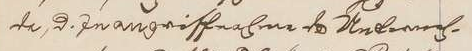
de, d. Inangriffnahme ds Unterneh-
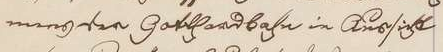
mens der Gotthardbahn in Aussicht
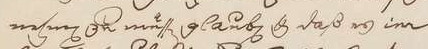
nehmen zu müssen glauben & daß es im
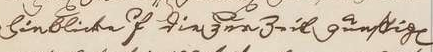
Hinblicke auf die zur Zeit günstigen
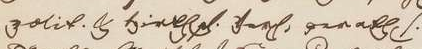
polit. & wirtsch. Verh. gerathen s.
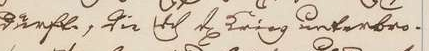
dürfte, die dch den Krieg unterbro-
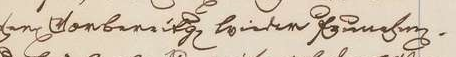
chenen Vorbereitungen wieder aufzunehmen.
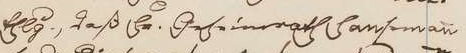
thlg., daß Hr. Geheimrath Hansemann
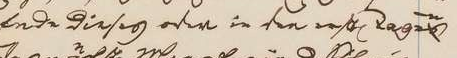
Ende dieses oder in den ersten Tagesn
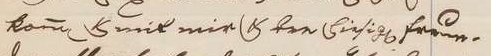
kommen & mit mir & den hiesigen Freun-
